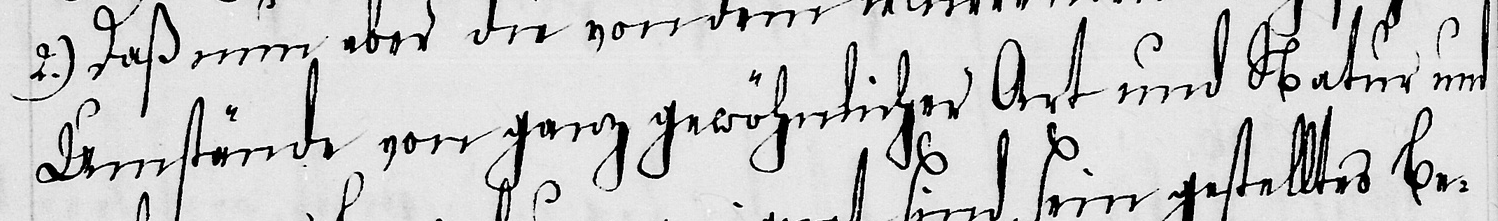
Umstände von ganz gewöhnlicher Art und Natur und
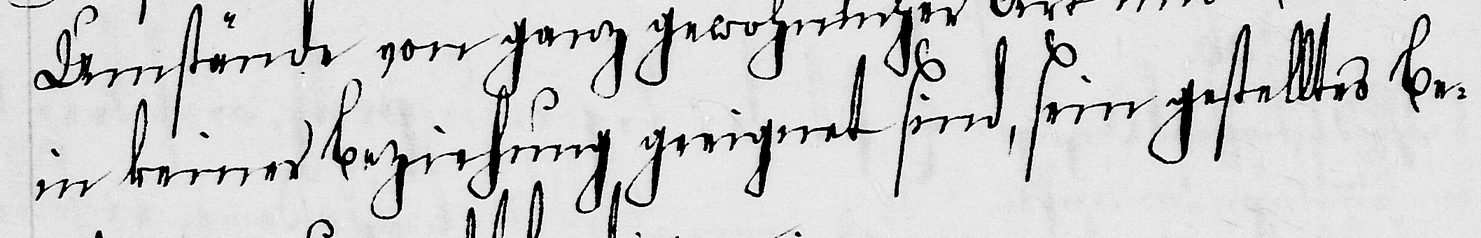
in keiner Beziehung geeignet sind, sein gestelltes B¬
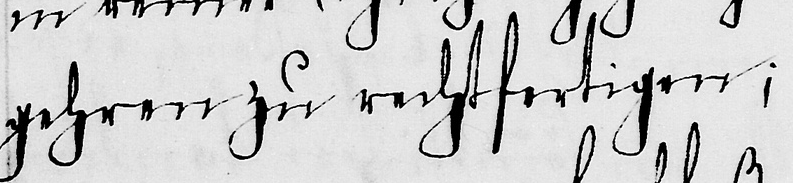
gehren zu rechtfertigen;
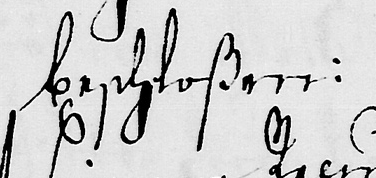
beschloßen:
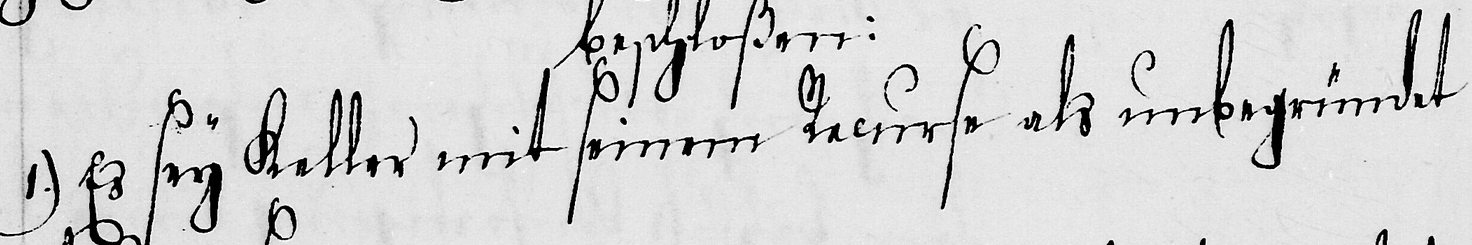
Es sey Keller mit seinem Recurse als unbegründet
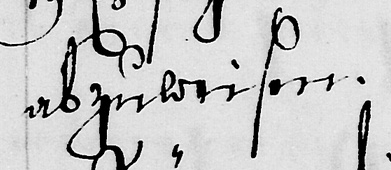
abzuweisen.
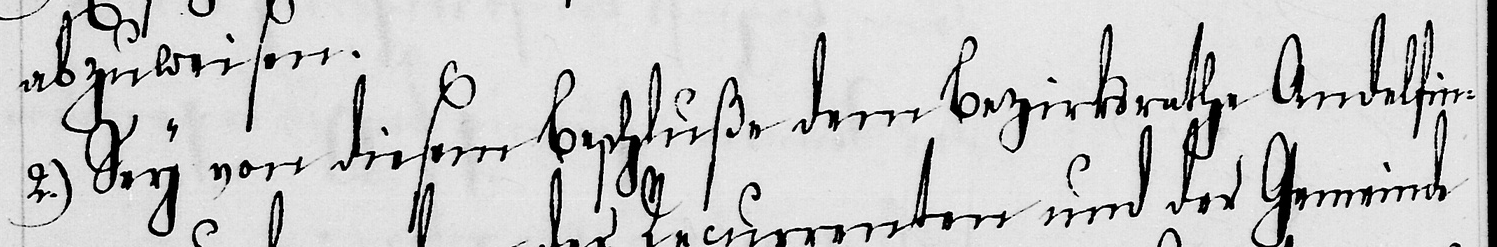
2.) Sey von diesem Beschluße dem Bezirksrathe Andelfi¬
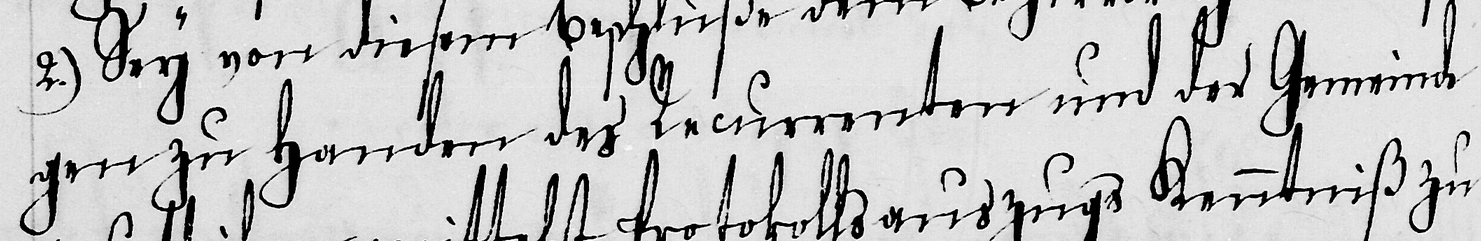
ngen zu Handen des Recurrenten und der Gemeinde
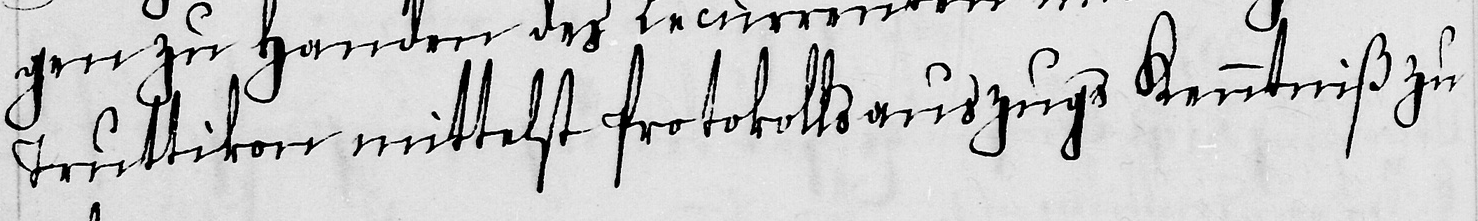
Truttikon mittelst Protokollsauszugs Kenntniß zu
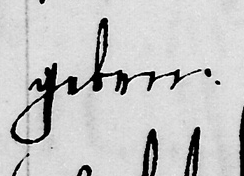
geben.
